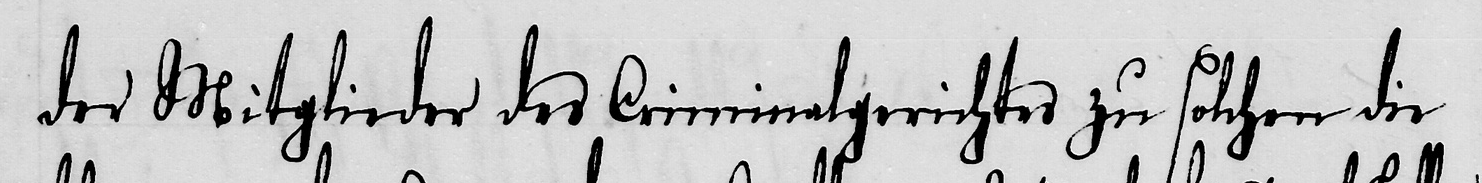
der Mitglieder des Criminalgerichtes zu solchen die
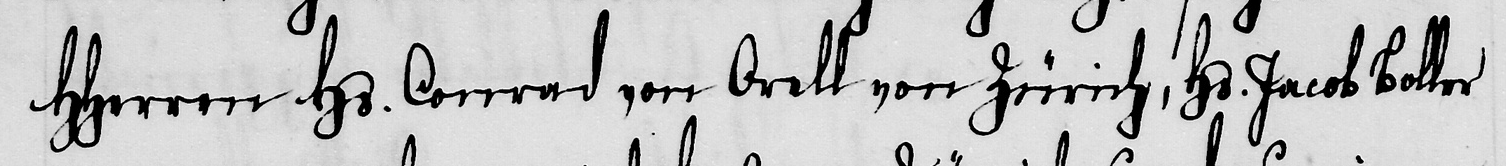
HHerren Hs. Conrad von Orell von Zürich, Hs. Jacob Bol¬
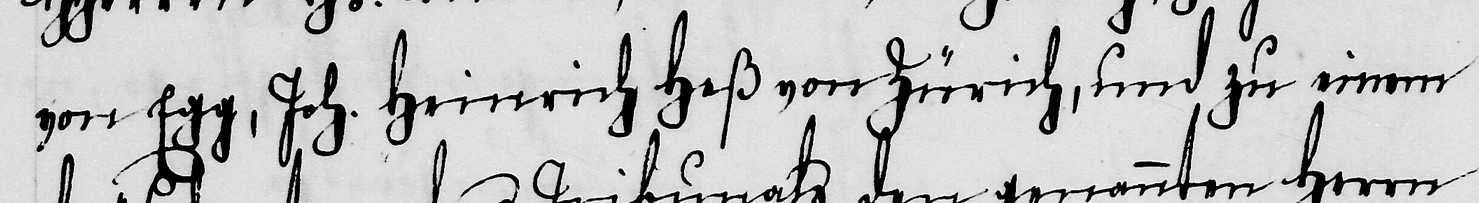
von Egg, Joh. Heinrich Heß von Zürich, und zu einem
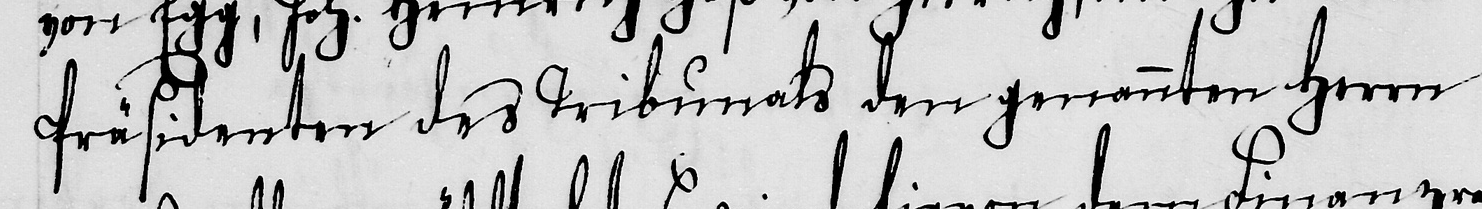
Präsidenten des Tribunals den genannten Herrn
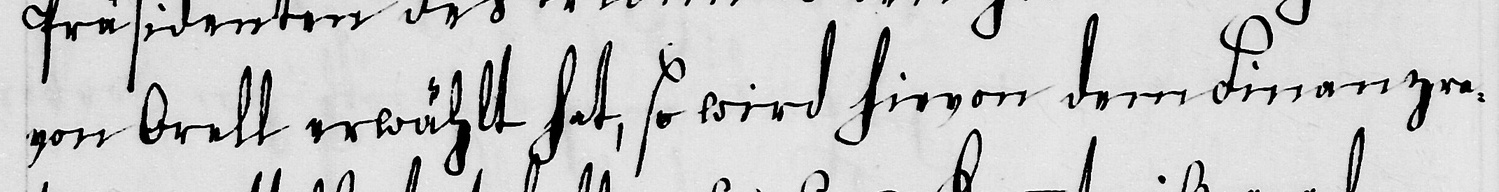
von Orell erwählt hat, so wird hievon dem Finanzra¬
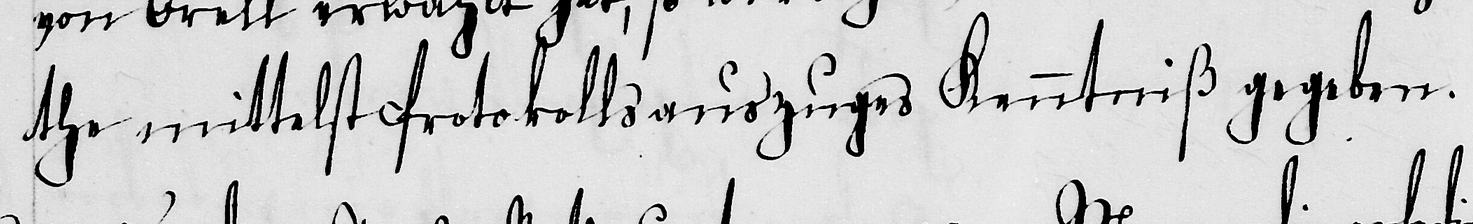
the mittelst Protokollsauszuges Kenntniß gegeben.
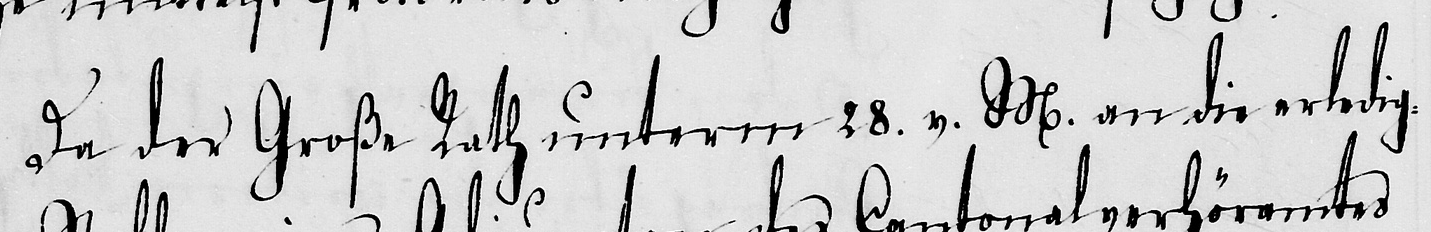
Da der Große Rath unterm 28. v. M. an die erledi¬
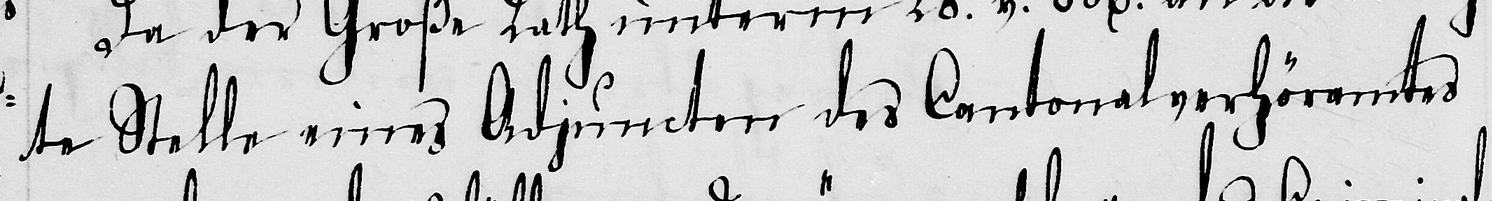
gte Stelle eines Adjuncten des Cantonalverhöramtes
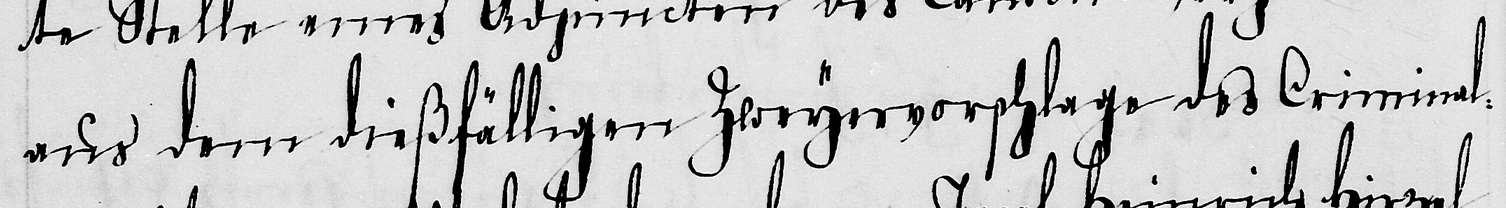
aus dem dießfälligen Zweyervorschlage des Crimina¬
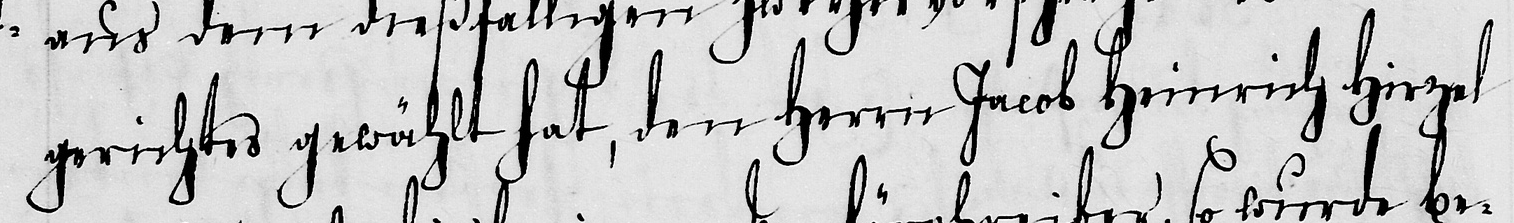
lgerichtes gewählt hat, den Herrn Jacob Heinrich Hirzel
